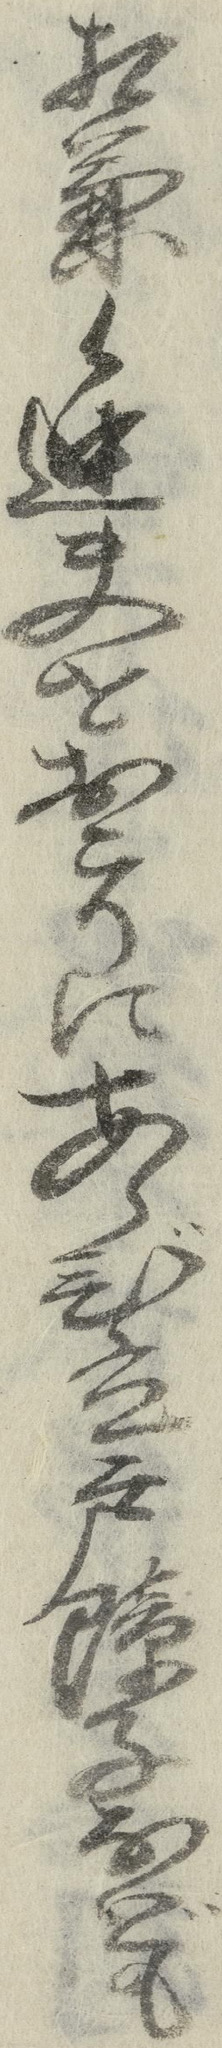相兼々迚夫をおこりにあらび立戸障子なども

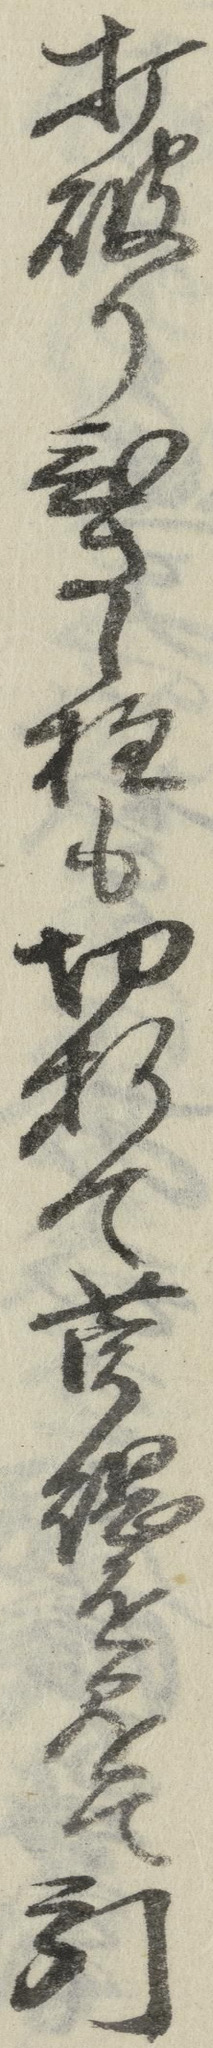打破りひさし柱も切折て荢縄を懸けて引
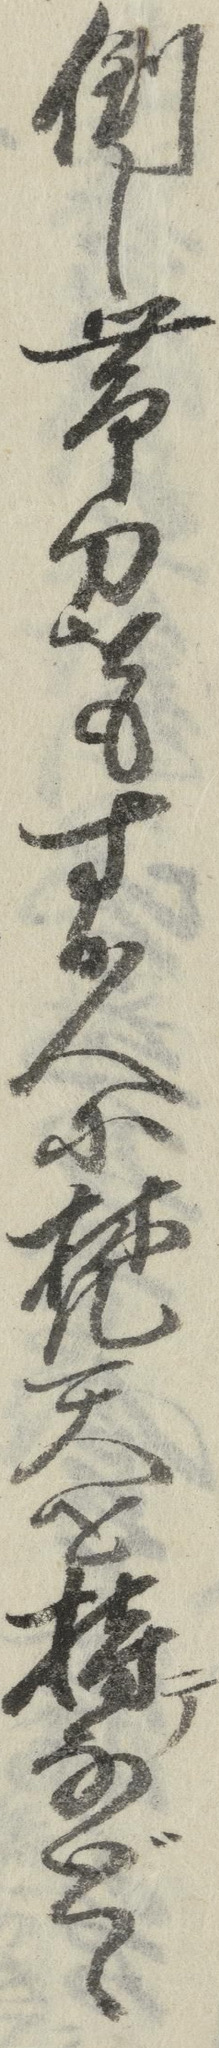倒し帯刀をもする人に梵天を持ゝ
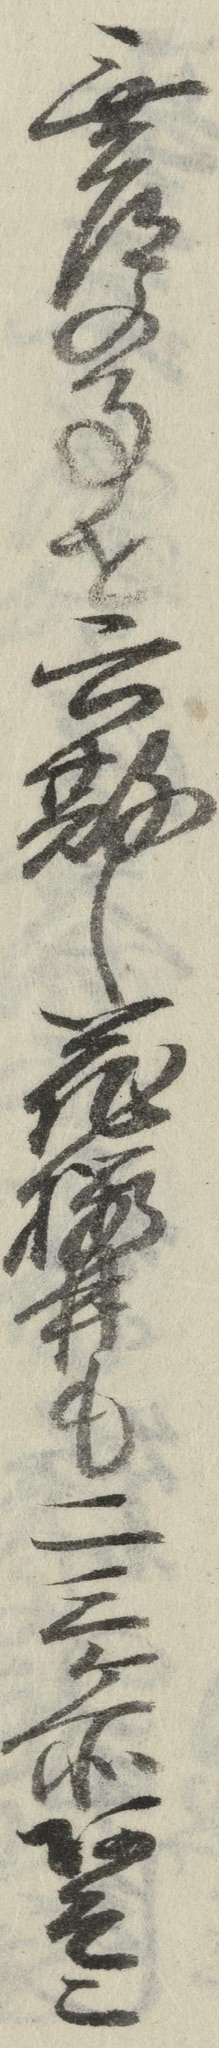無道の事を云散し花桜井も二三ケ所あそこ
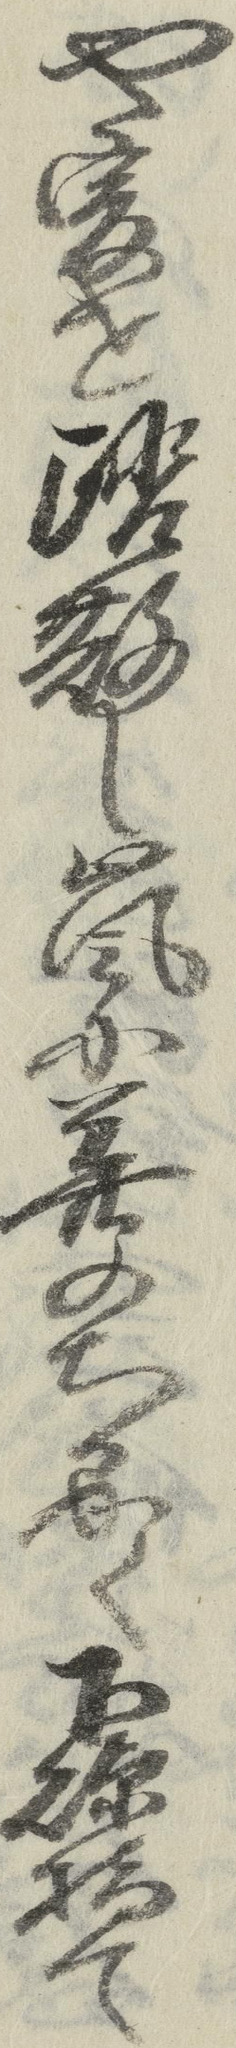や爰を踏散し嵐に華のちる如く下練指て
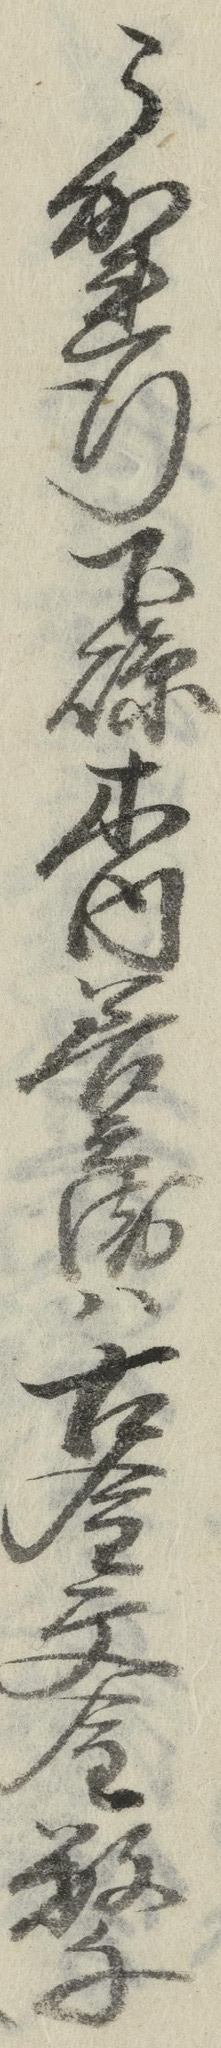うかれ行下練木内善兵衛は古金文金数千
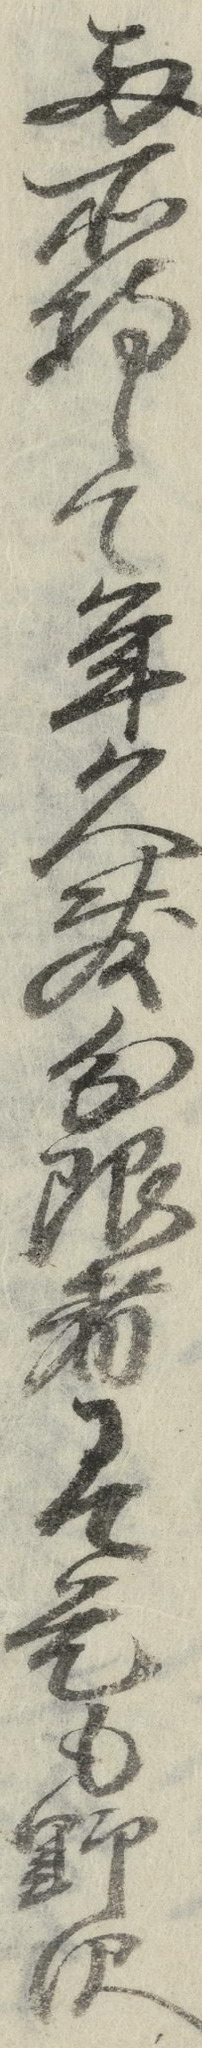両所持して年久敷分限者にて是も野沢
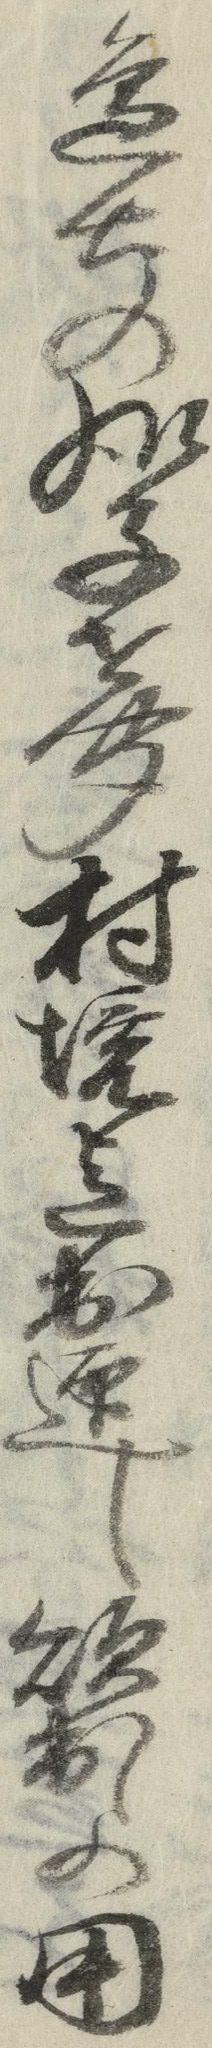邊土の様子を聞村境迄出迎し炊出しの用
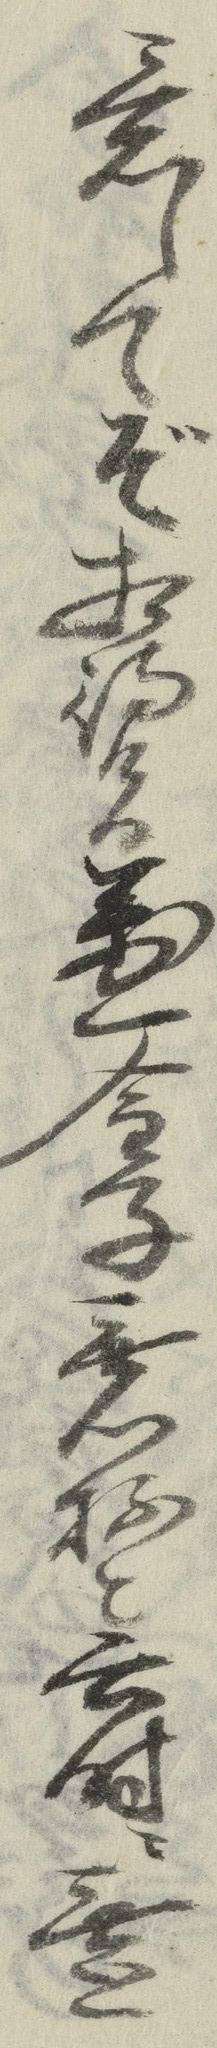意してぞ相待ける万一金子無心抔と云時に無と
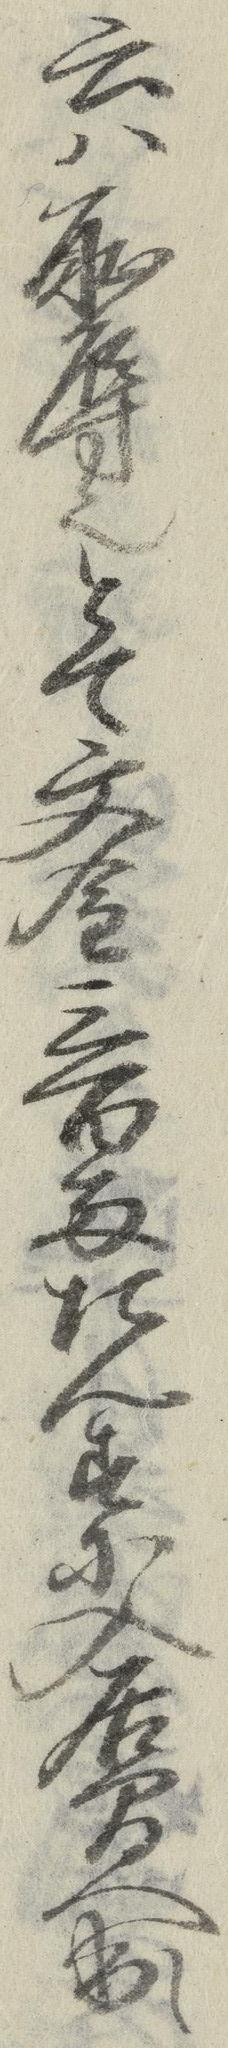云は恥辱也とて文金三百両たんすに入居間へ出し
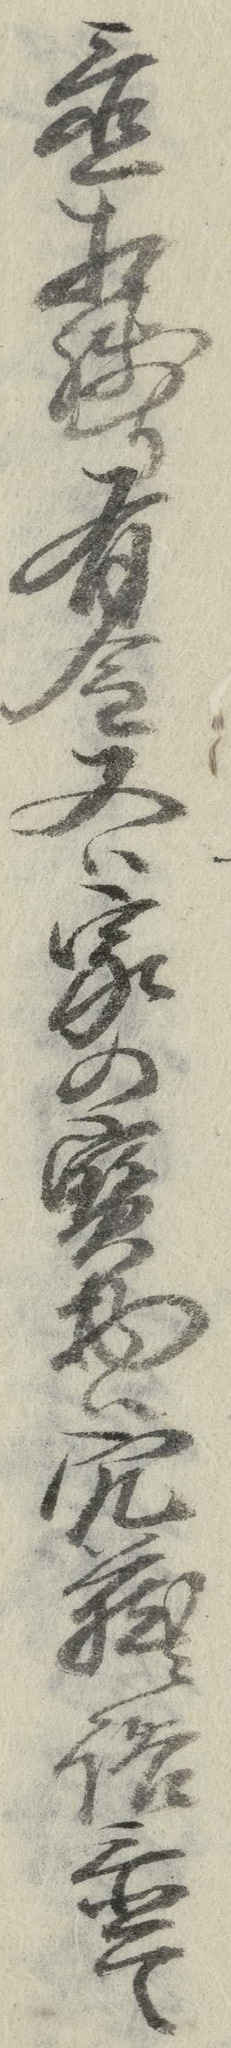置相残り有金又は家の宝物は穴蔵に詰置て
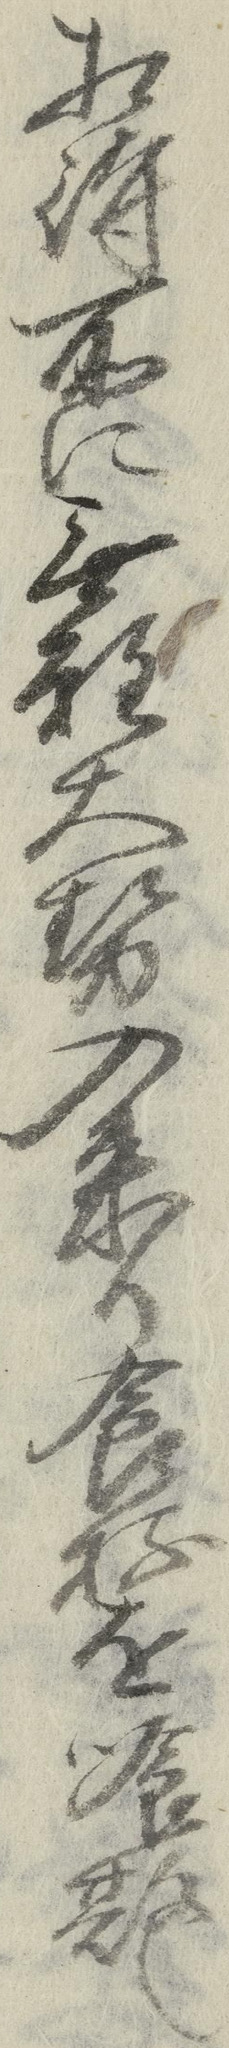相待所に無頼大勢入来り食抔を喰散し
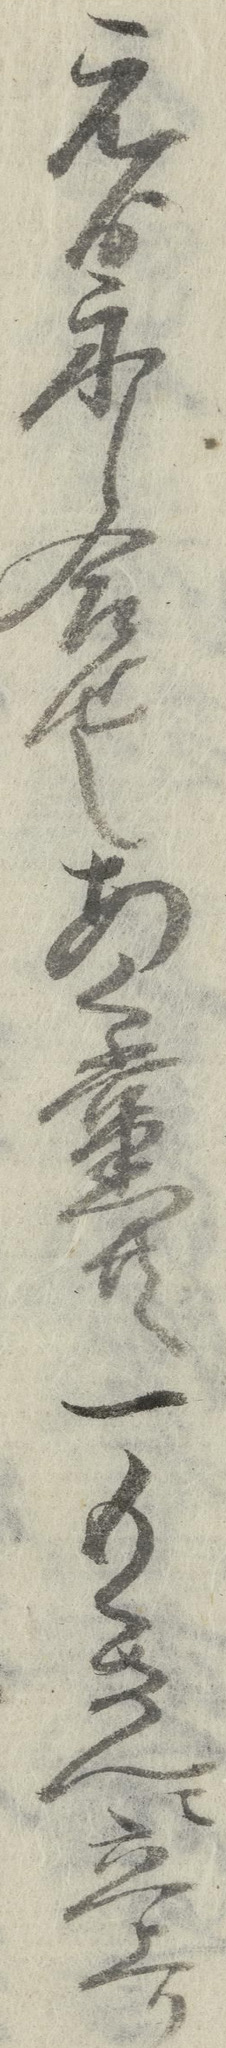元ゟ示し合せしあく党共一もくさんに立上り
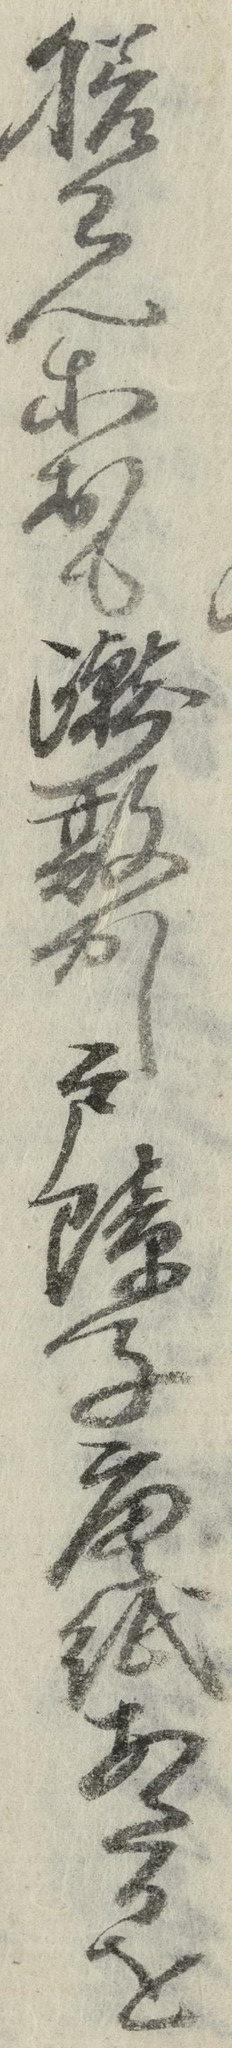膳わん等おも蹴散かし戸障子唐紙あたるを
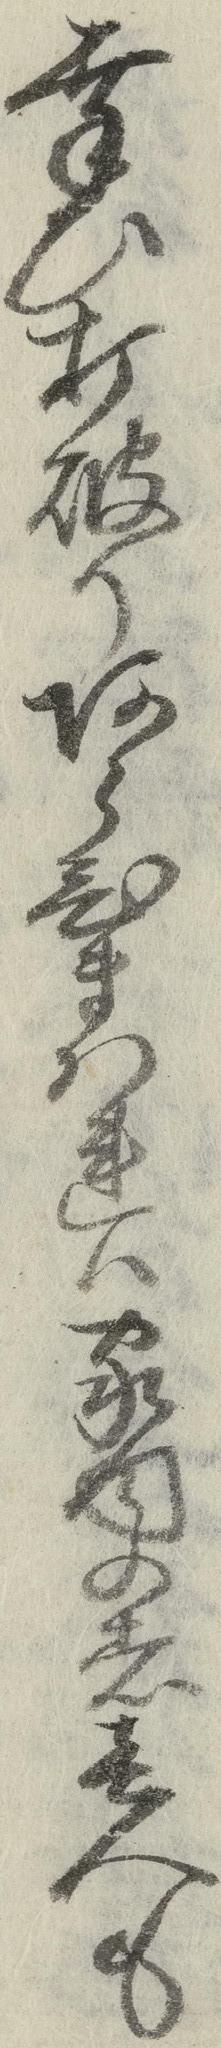幸ひ打破りあらひまわれは家内の者壱人も
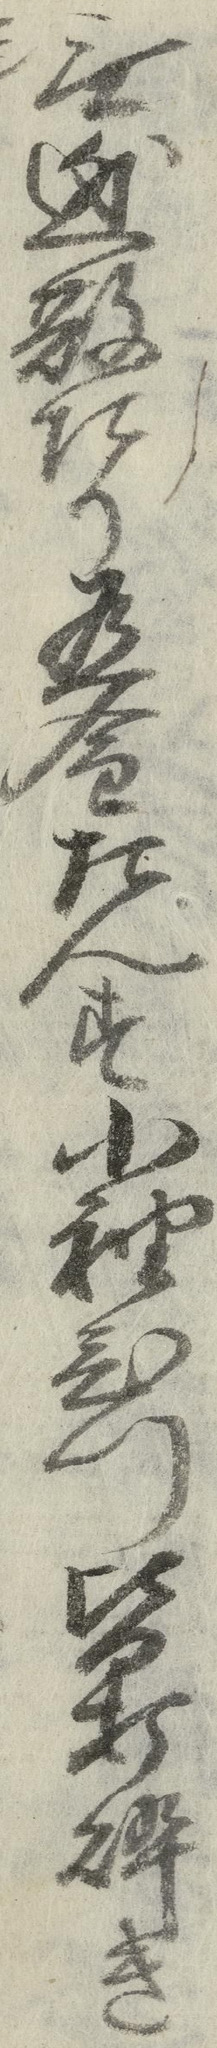無迯散たり有金たんす小袖ひつ皆打砕き
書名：浅間大焼騒動記　中
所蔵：東京大学地震研究所図書室 Earthquake Research Institute Library, The University of Tokyo, JAPAN
